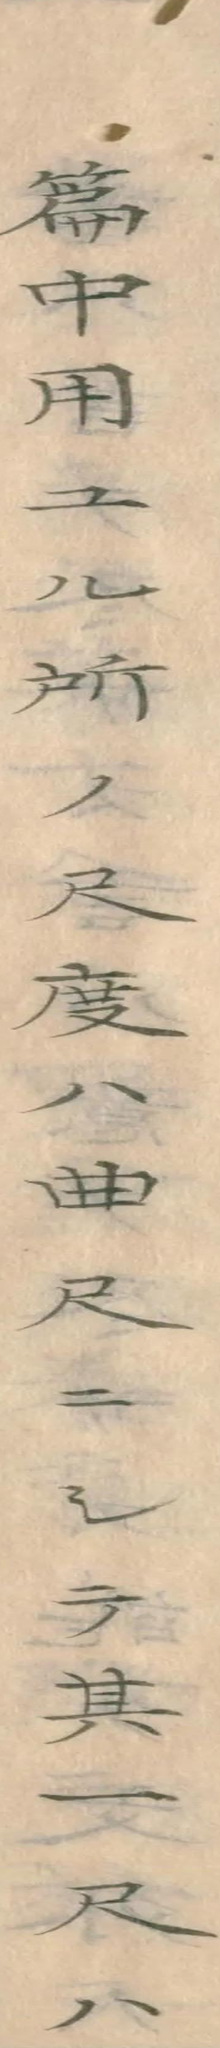一篇中用ユル所ノ尺度ハ曲尺ニシテ其一尺ハ
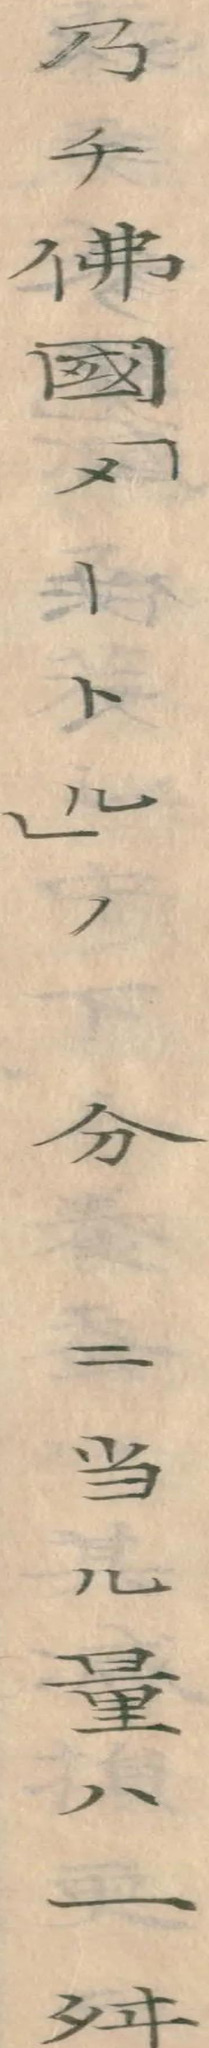乃チ仏国「メートル」ノ分ニ当ル量ハ一升
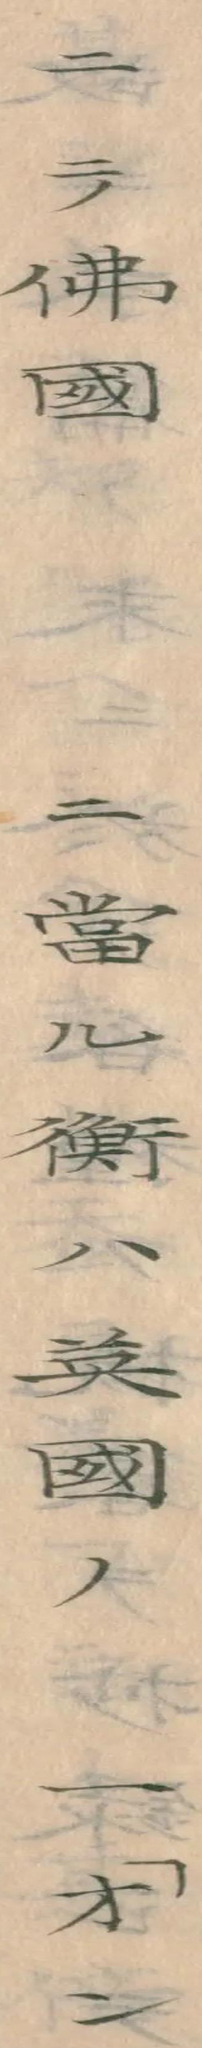ニテ仏国ニ当ル衡ハ英国ノ一「オン
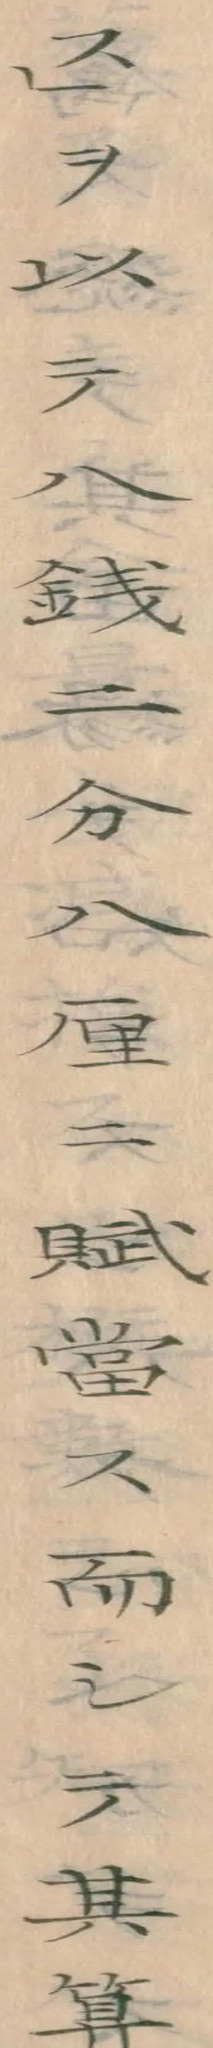ス」ヲ以テ八銭二分八厘ニ賦当ス而シテ其算
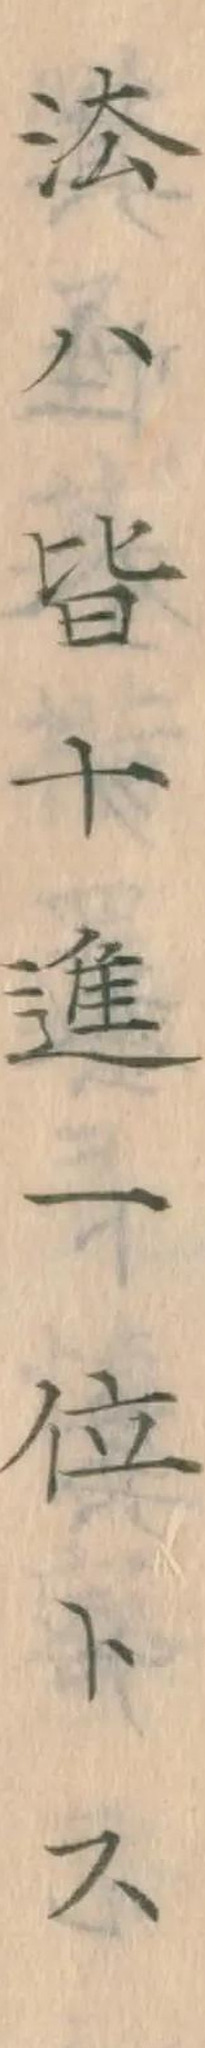法ハ皆十進一位トス
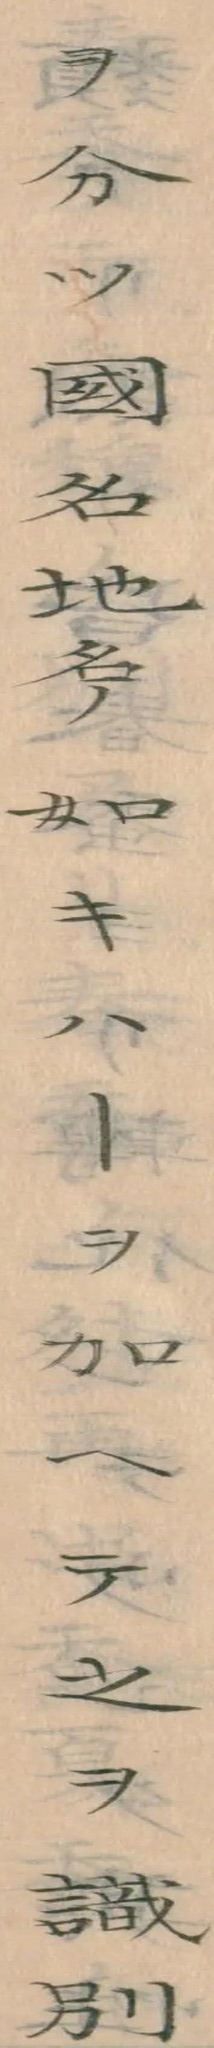ヲ分ツ国名地名ノ如キハ─ヲ加ヘテ之ヲ識別
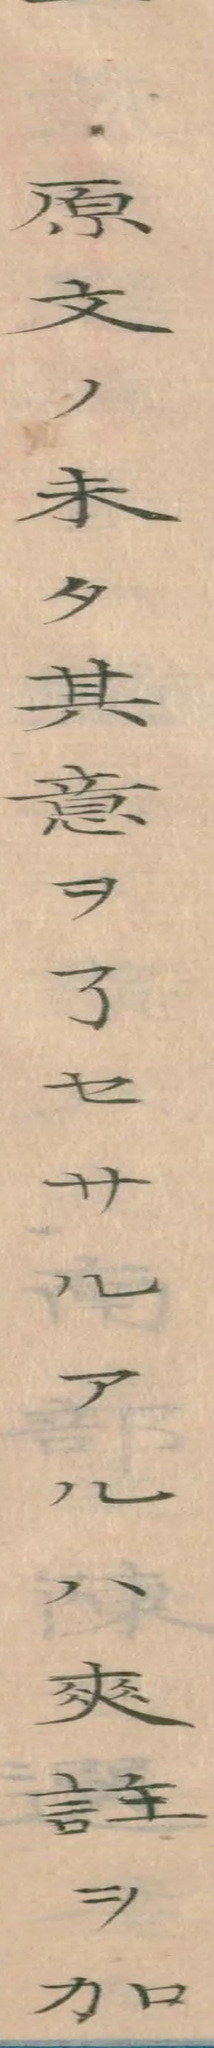一原文ノ未タ其意ヲ了セサルアルハ爽註ヲ加
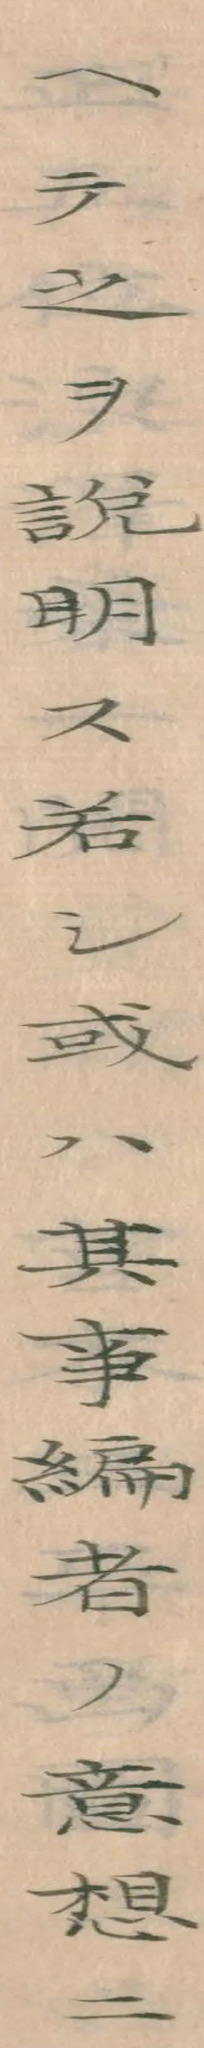ヘテ之ヲ説明ス若シ或ハ其事編者ノ意想ニ
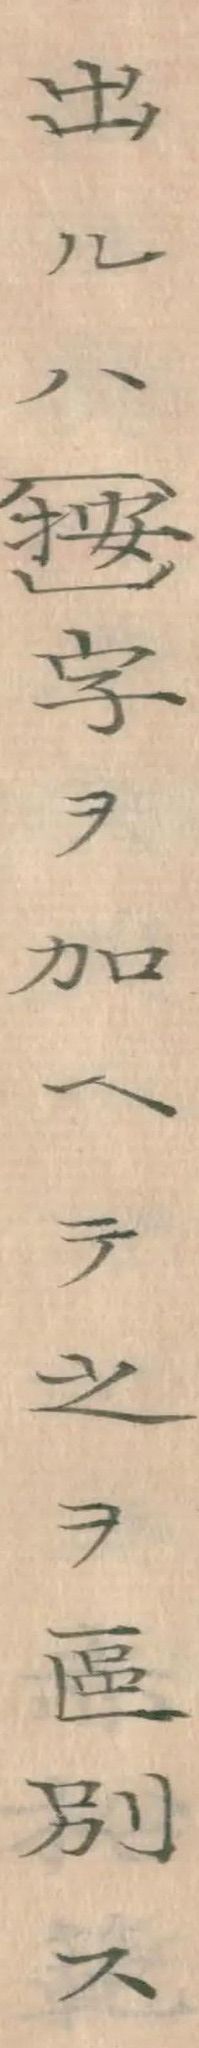出ルハ[按]字ヲ加ヘテ之ヲ区別ス
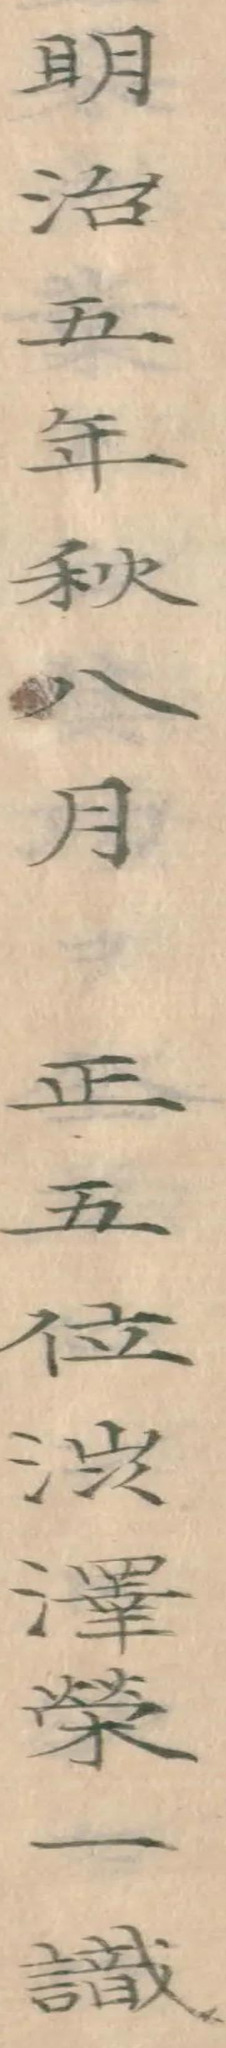明治五年秋八月正五位渋沢栄一識

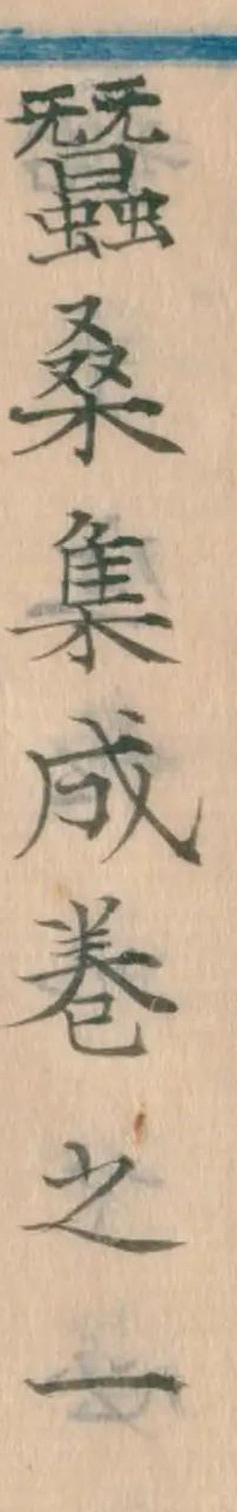蚕桑集成巻之一
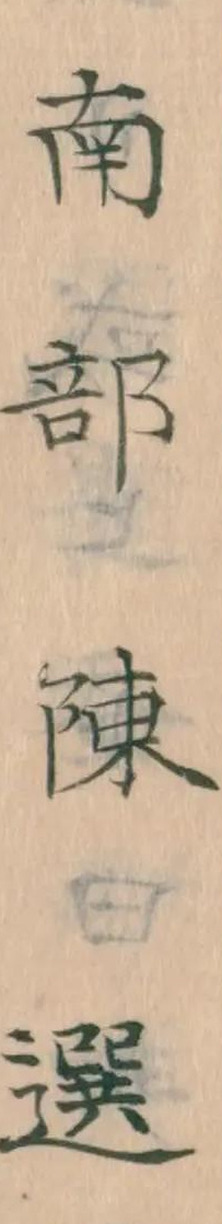南部陳選
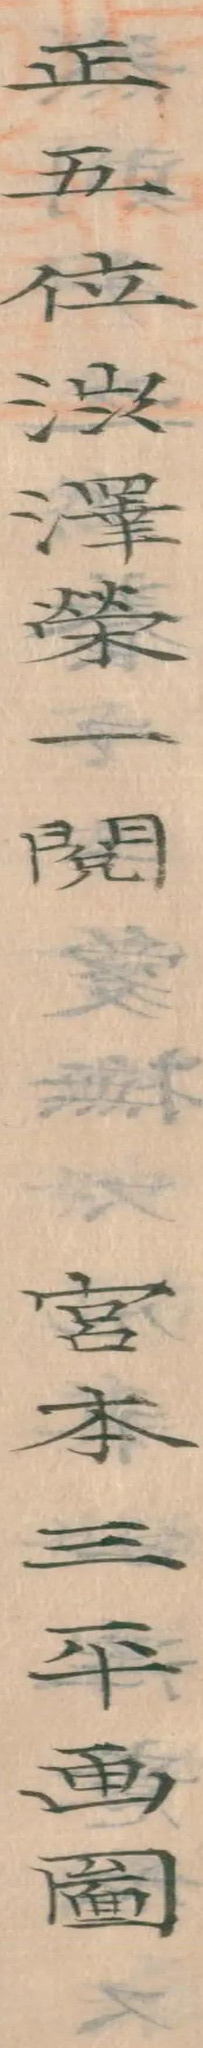正五位渋沢栄一閲宮本三平画図
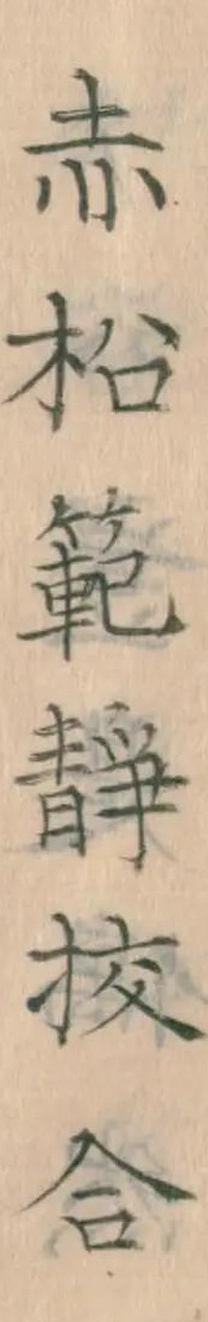赤柗範静挍合
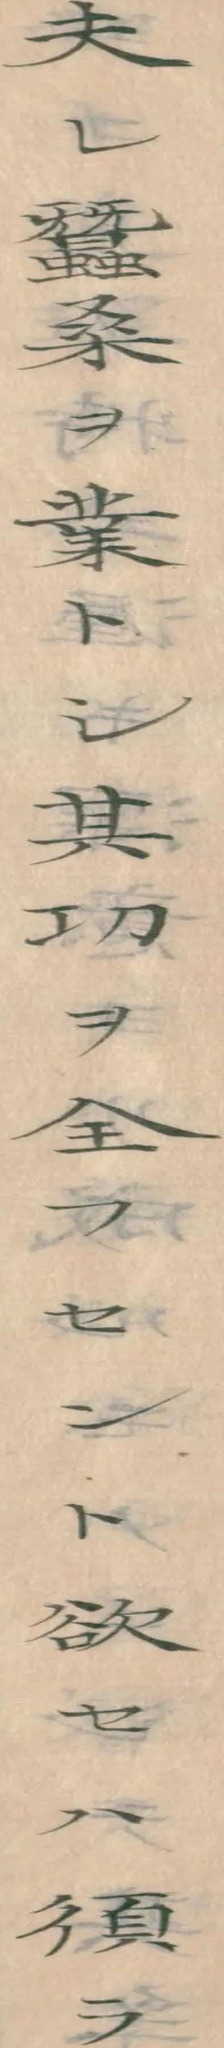夫レ蚕桑ヲ業トシ其功ヲ全フセント欲セハ須ラ
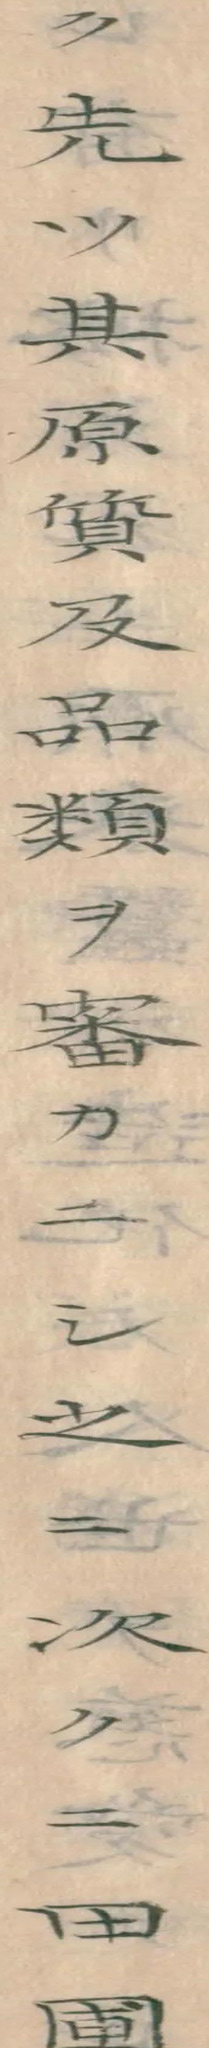ク先ツ其原質及品類ヲ審カニシ之ニ次クニ田圃
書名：蚕桑集成
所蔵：国立国会図書館 National Diet Library, JAPAN
